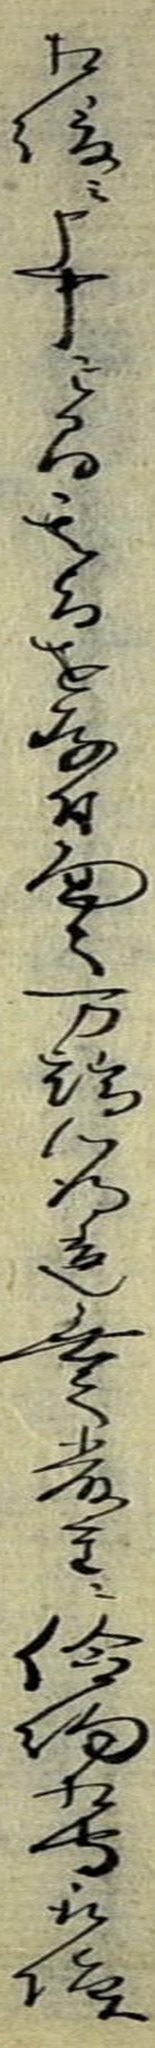相緩み申事に候間其旨を存付面々万端心得違無之厳重に倹約相守取続
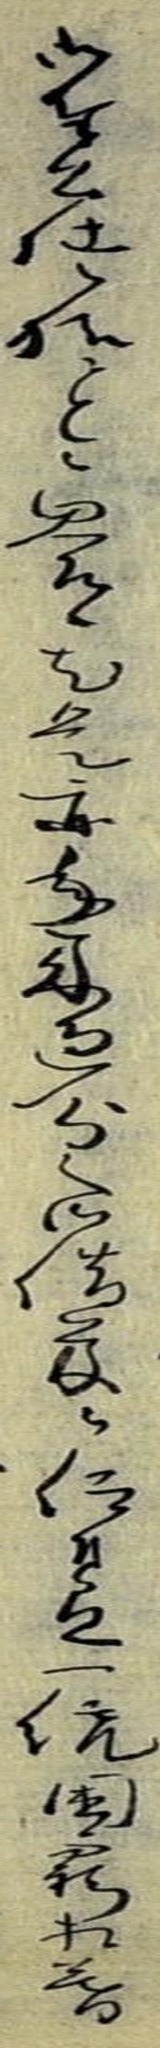御奉公仕候様にと被思召候尤是亦年来過分之御借米被仰付置一統困窮相暮
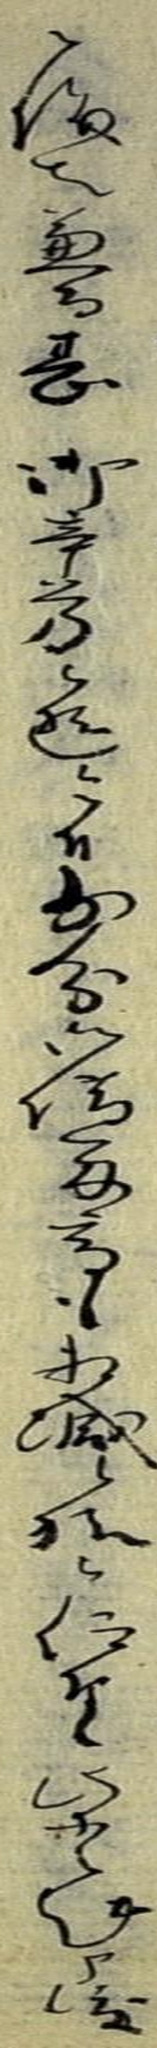候儀は兼而甚御辛労被遊候に付少分御借米高も相減候様被仰付候此等之趣申渡
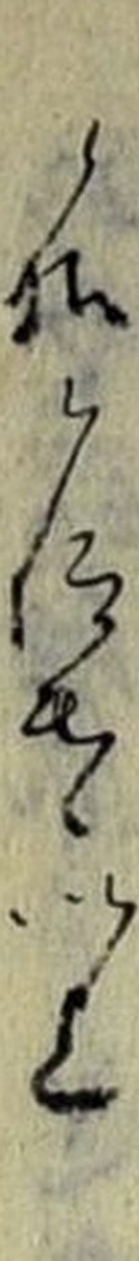候様被仰出候以上
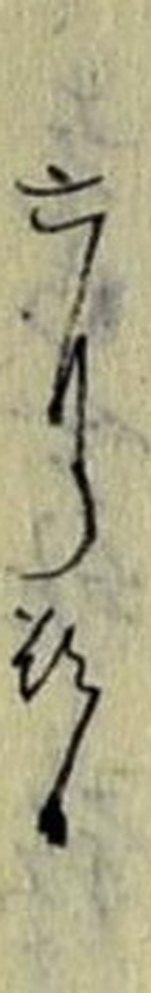六月朔日
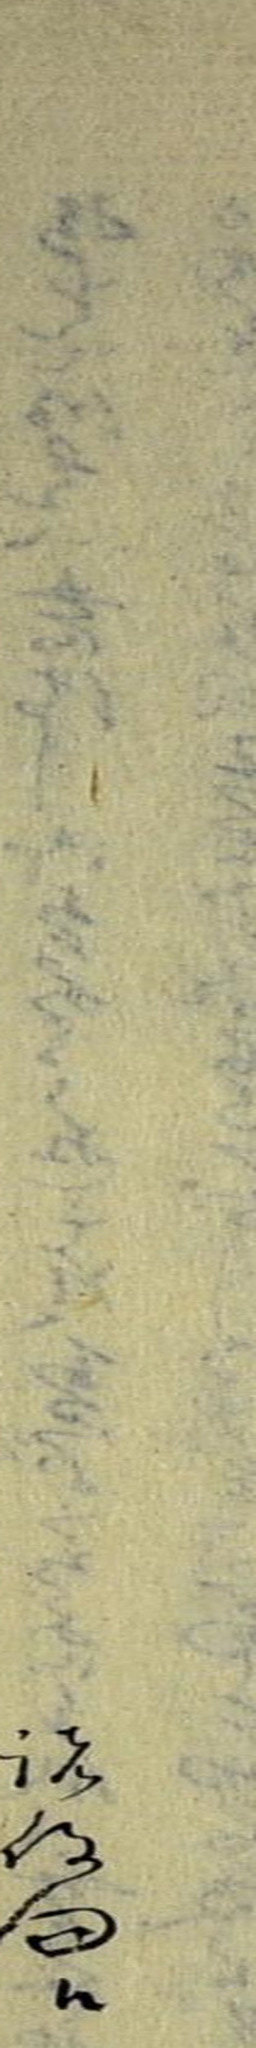諸役向え
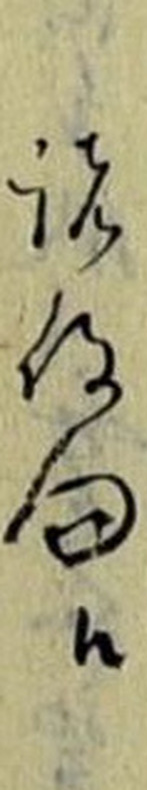諸役向え
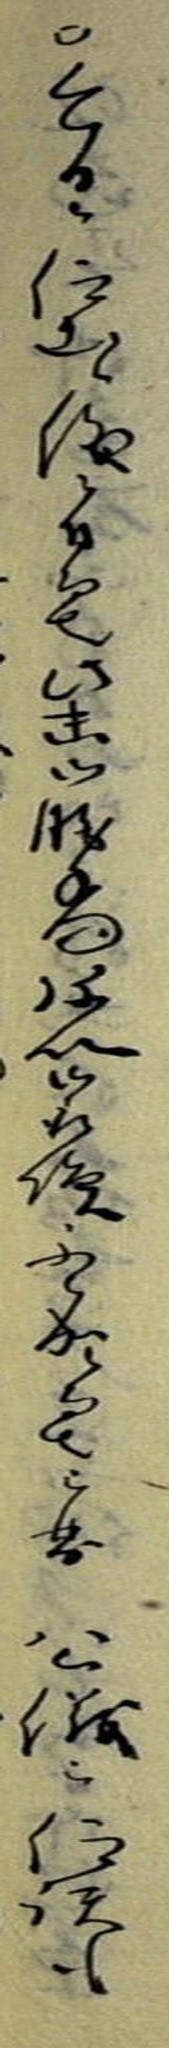〇今日被仰出候儀に付而は此末御勝手向弥以御取続不被成候而は被対公儀被仰訳も
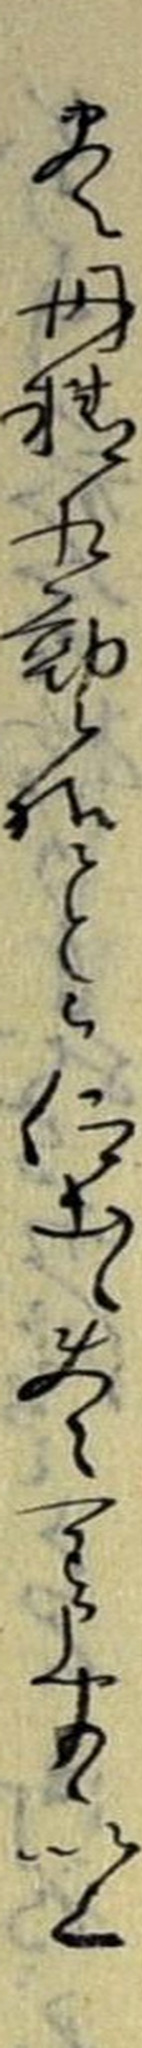夫々丹精相勤候様にと被仰出候夫々可被申聞候以上
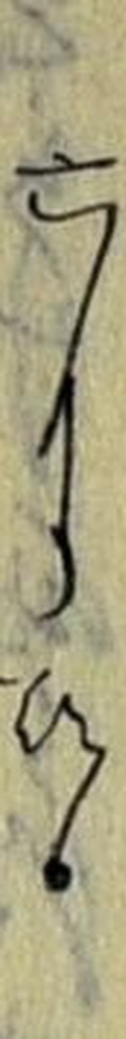六月朔日
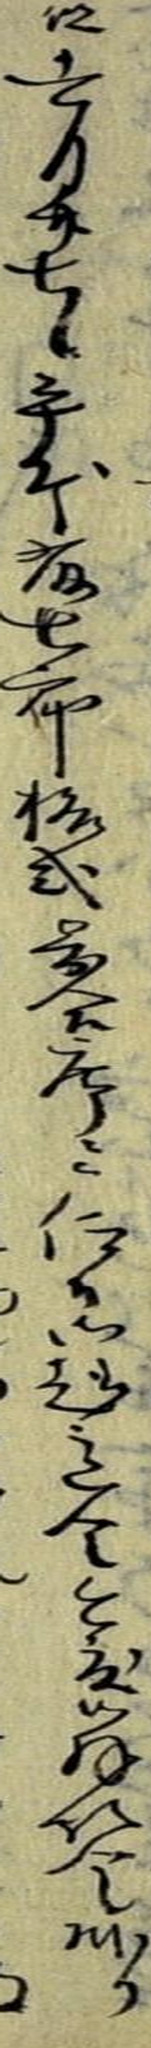但去月廿七日平本藤七郎格式寄合席に被仰付御趣意金今度御拝領金掛り
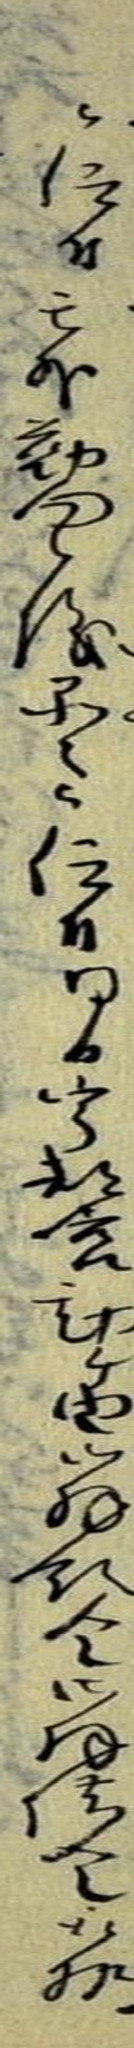被仰付其外勤向之儀品々被仰付同日宇都宮勘ヶ由御拝領金御拝借金取扱
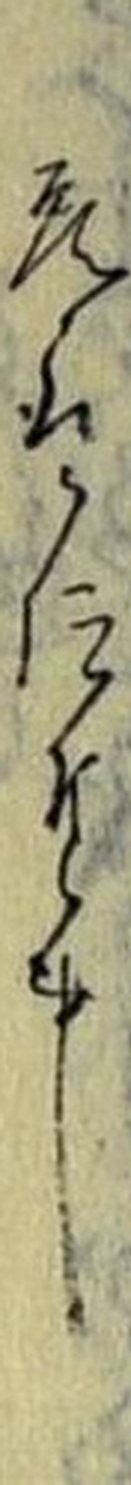頭取被仰付候事
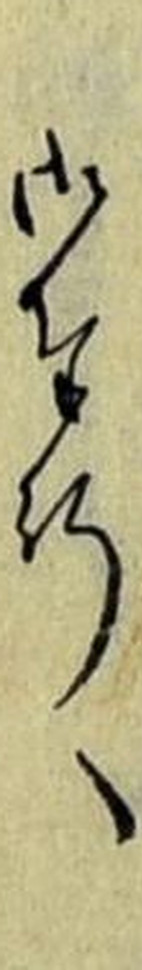御奉行へ
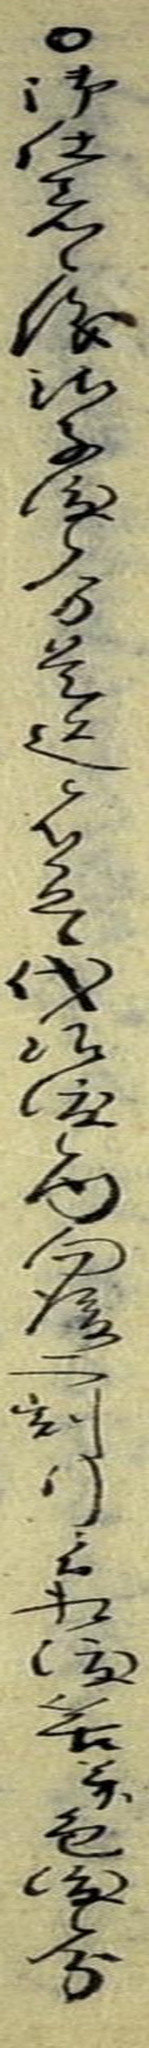〇御仕着之儀銀子渡し分是迄被下置候代銀渡之内向後二割引に而相渡筈并色渡し分
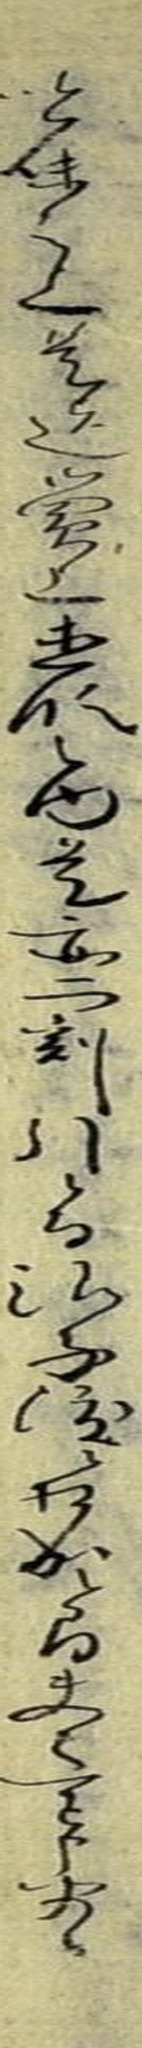吟味之上是迄御買上直段之内是亦二割引に而銀子渡に相成候間夫々可被申聞候
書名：命令之部 二
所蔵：福井県文書館 Fukui Prefectural Archives
